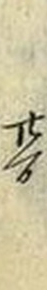廿九日
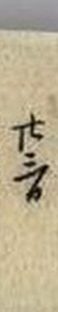廿九日
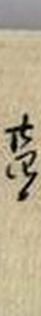廿九日
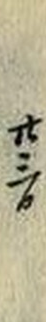廿九日
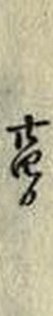廿九日
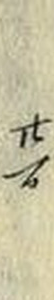廿九日
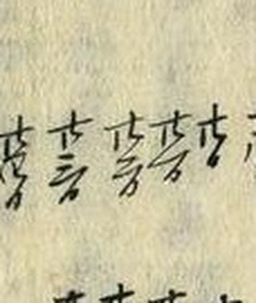廿九日
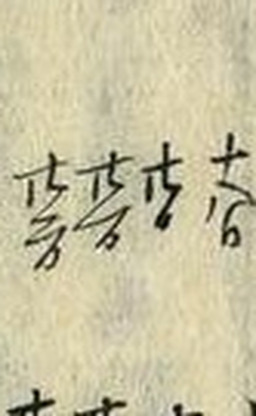廿九日
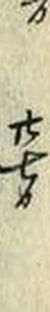廿九日
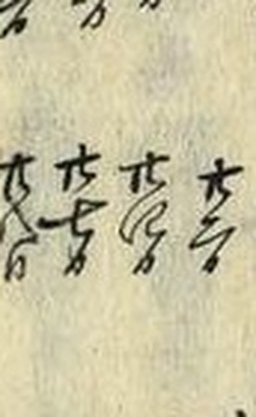廿九日
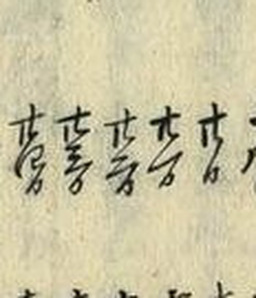廿九日
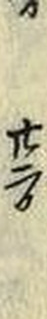廿九日
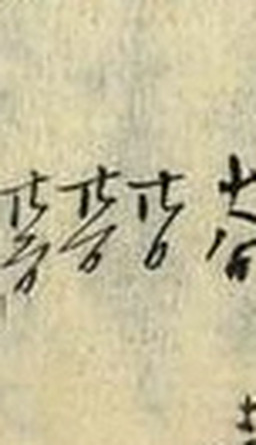廿九日
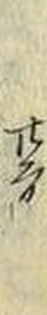廿九日
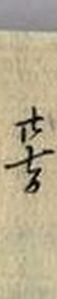廿九日
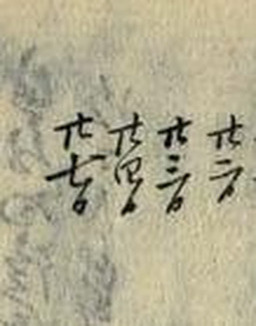廿九日
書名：少傅日録抄（斉承付側向頭取日記、在国）
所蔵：福井県文書館 Fukui Prefectural Archives
